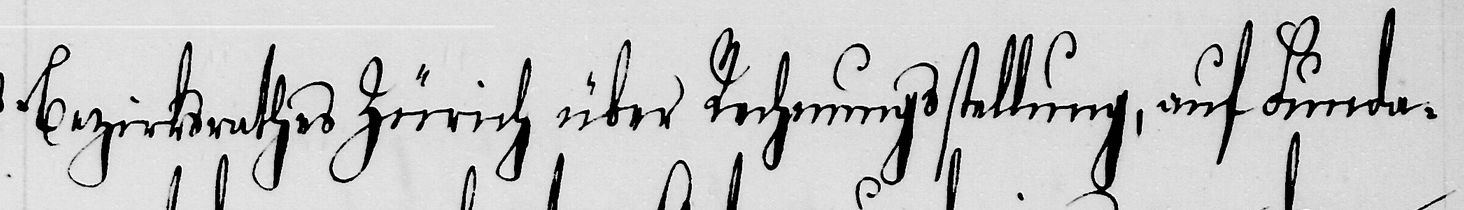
Bezirksrathes Zürich über Rechnungsstellung, auf Fu¬
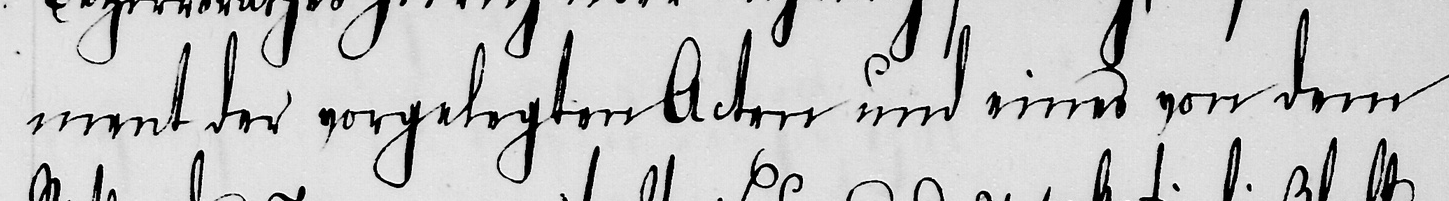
ment der vorgelegten Acten und eines von dem
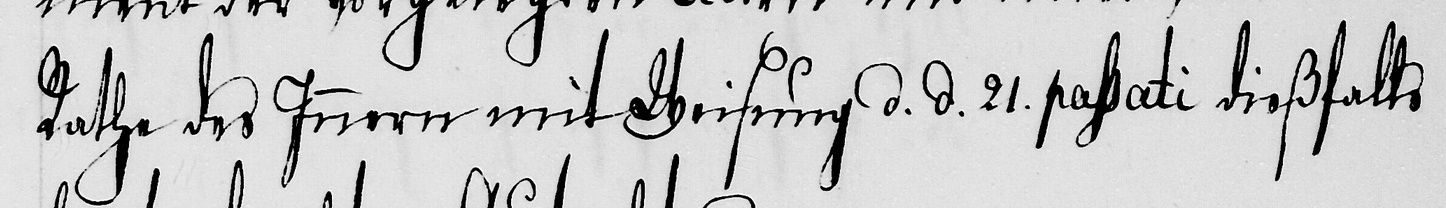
Rathe des Innern mit Weisung d. d. 21. passati dießfal¬
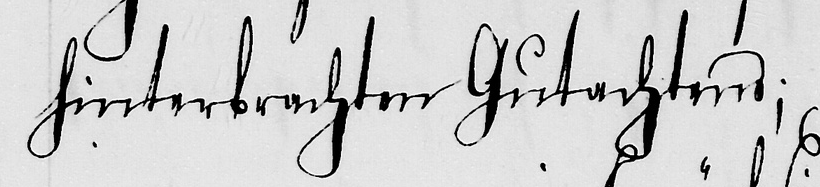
hinterbrachten Gutachtens;
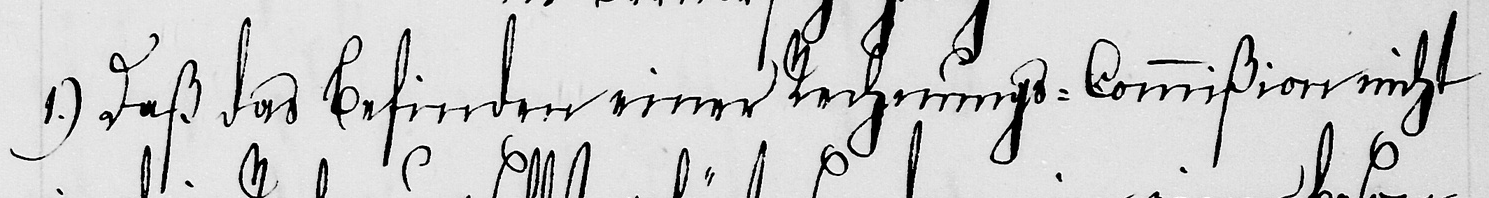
1.) Daß das Befinden einer Rechungs-Commißion nicht
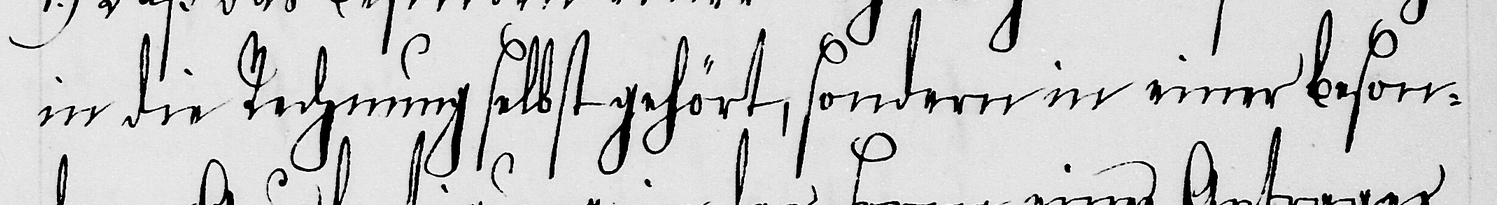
in die Rechnung selbst gehört, sondern in einer beson¬
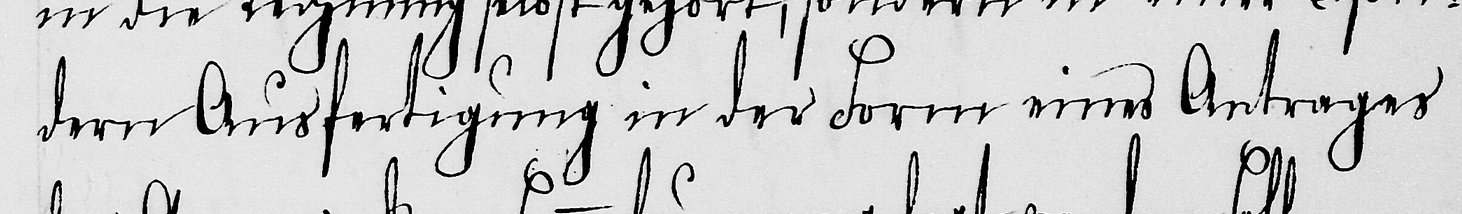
dern Ausfertigung in der Form eines Antrages
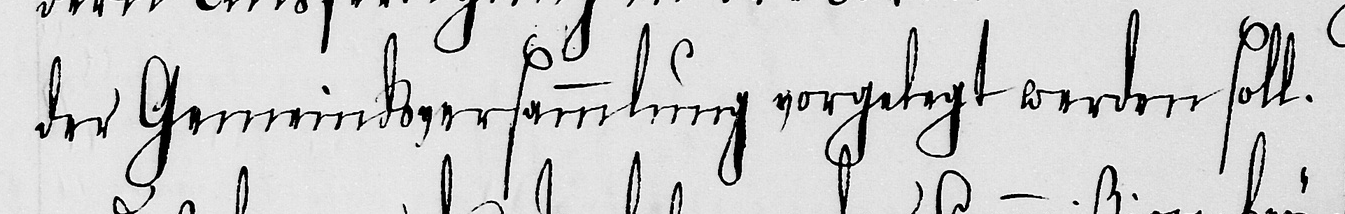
der Gemeindsversammlung vorgelegt werden soll.
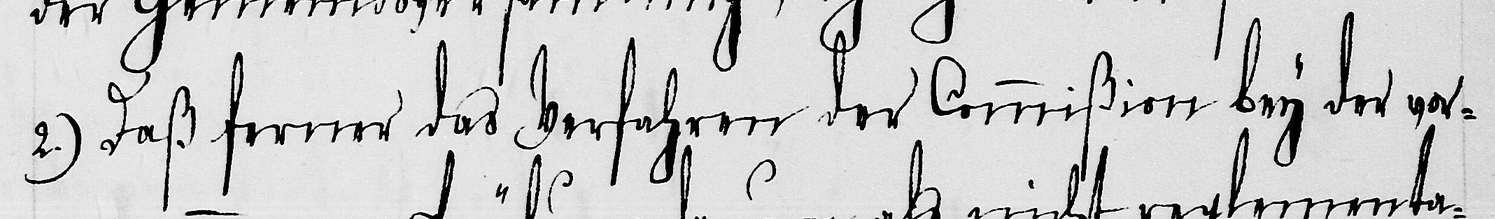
2.) Daß ferner das Verfahren der Commißion bey der vor¬
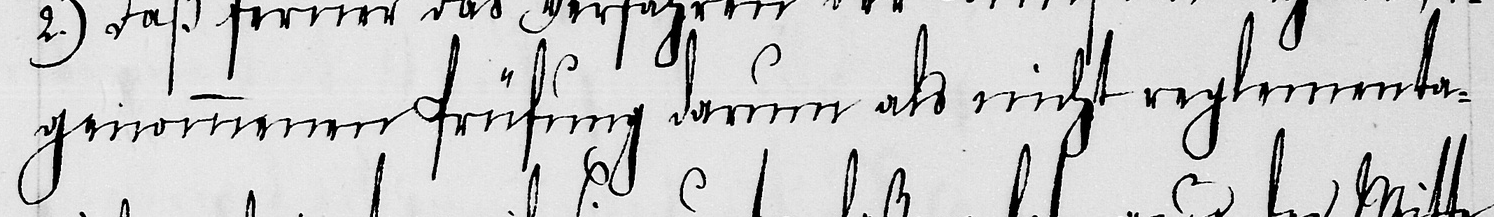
genommenen Prüfung darum als nicht reglementa¬
